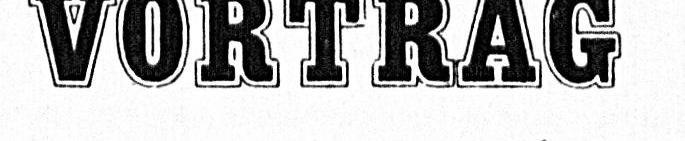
VORTRAG
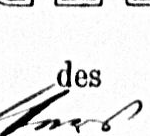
des
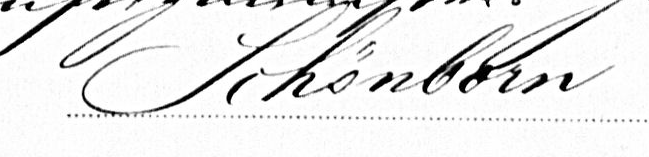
Schönborn
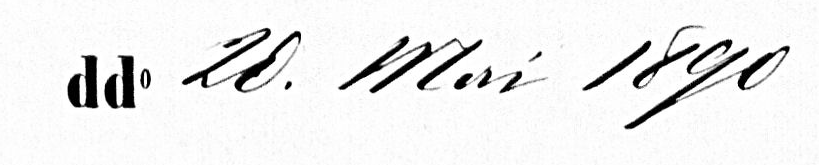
dd° 20 Mai. 1890
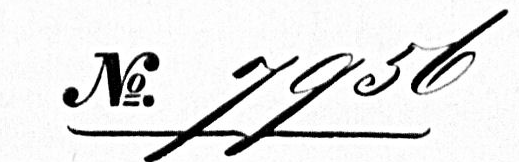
N°. 7956
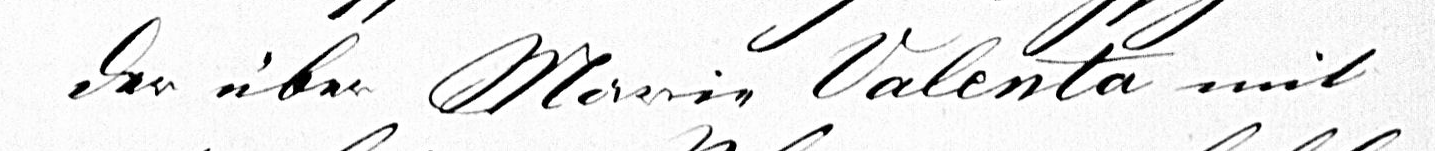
der über Marie Valenta mit
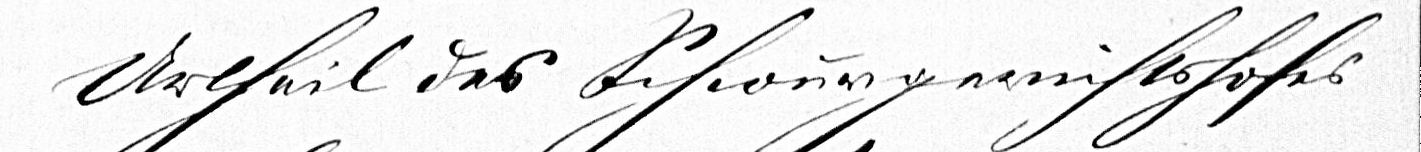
Urtheil des Schwurgerichtshofes
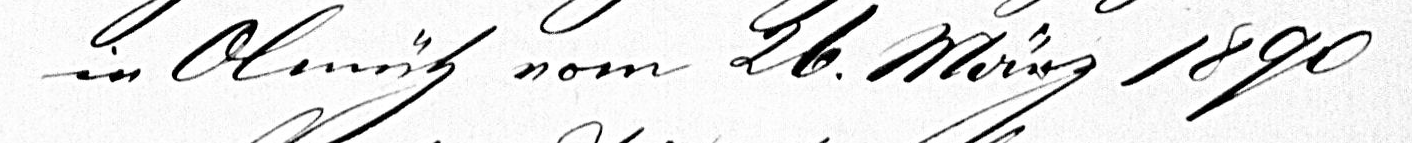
in Olmütz vom 26. März 1890
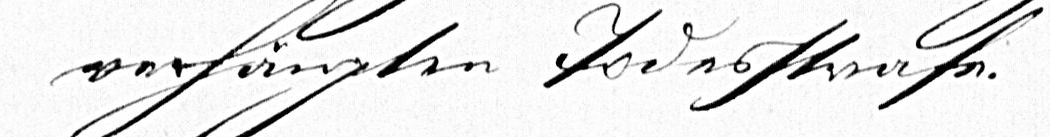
verhängten Todesstrafe.
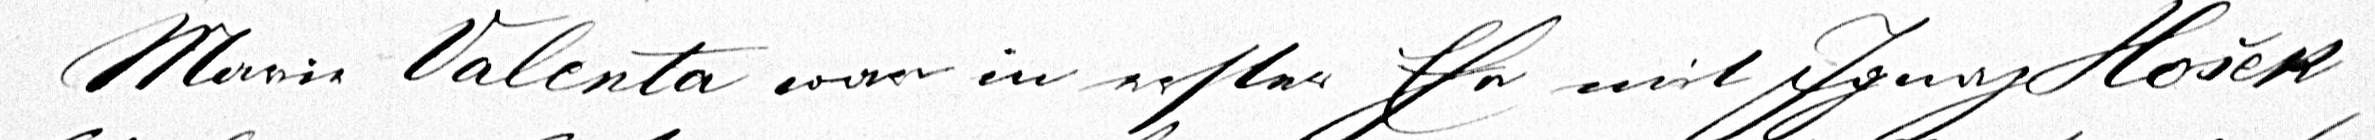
Marie Valenta war in erster Ehr mit Ignaz Hosek
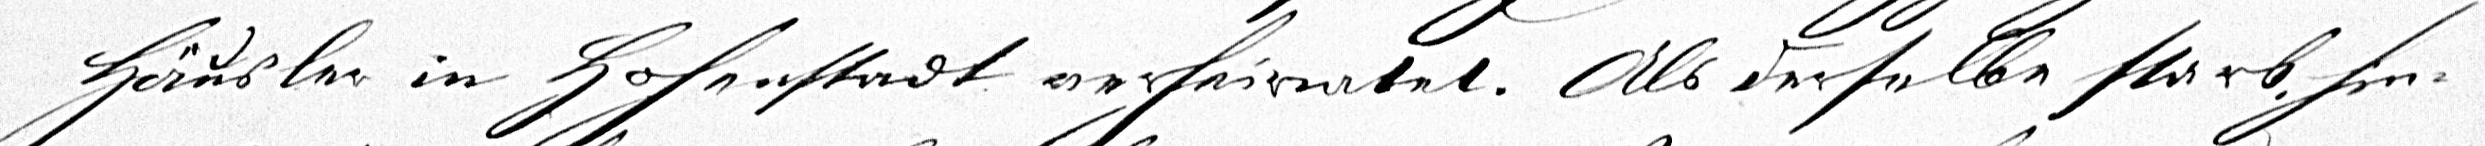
Häusler in Hoferstadt verheiratet. Als derselbe starb hin¬
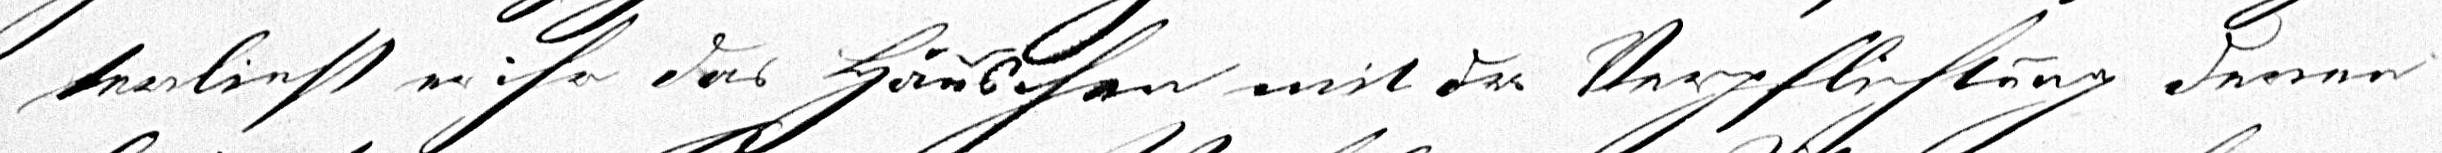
terließ er ihr das Häuschen mit der Verpflichtung derer
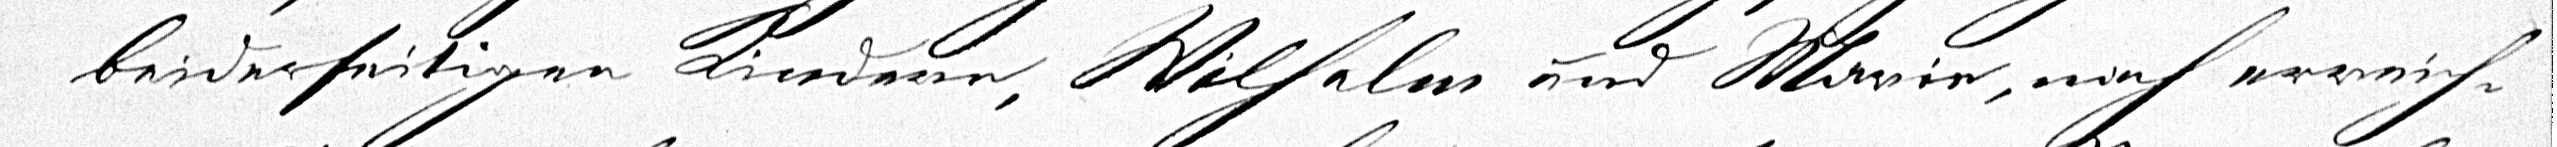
beiderseitiger Lindere, Wilhelm und Marie, noch erreich¬
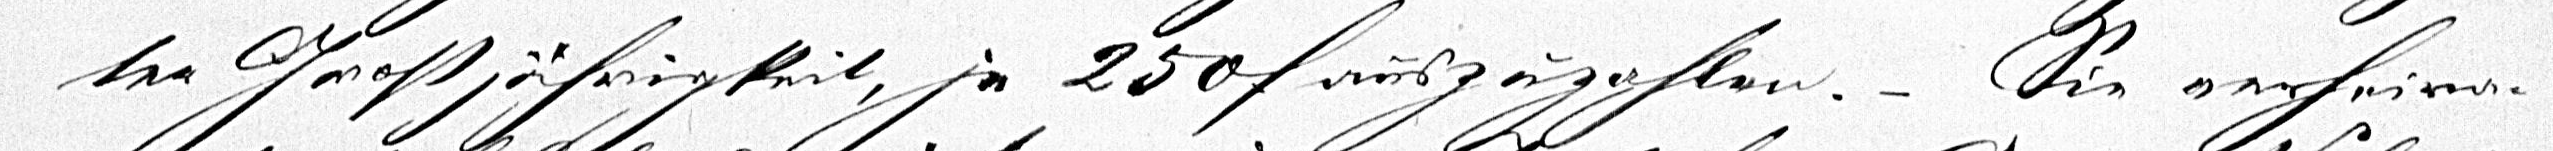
ter Großjährigkeit, ja 250 f auszuzahlen. - Sie verheira¬
